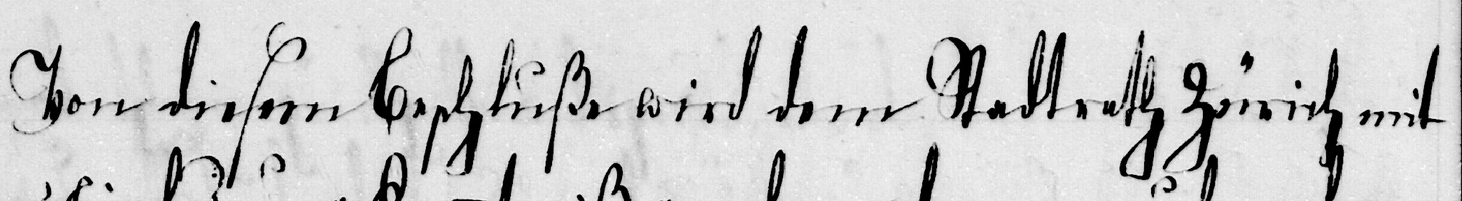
Von diesem Beschluß wird dem Stadtrath Zürich mit
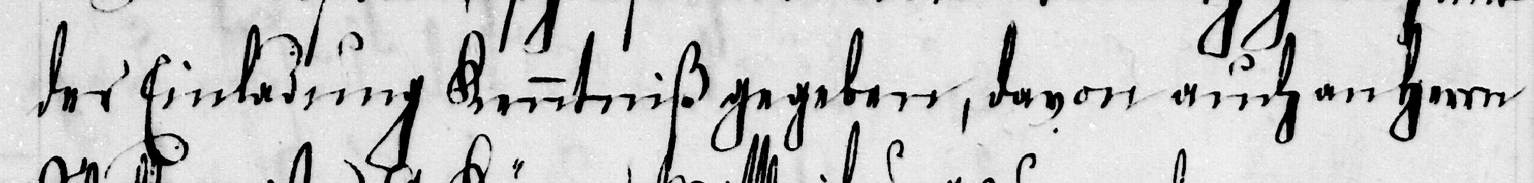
der Einladung Kenntniß gegeben, davon auch an Herrn
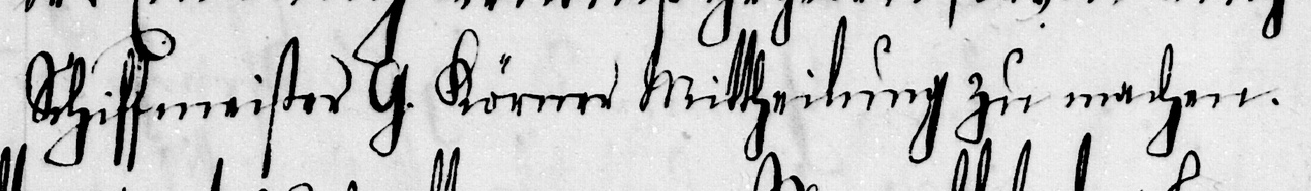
Schiffmeister G. Körner Mittheilung zu machen.
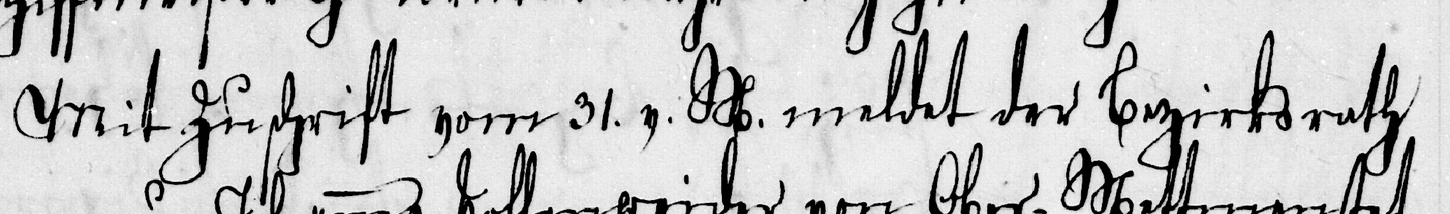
Mit Zuschrift vom 31. v. M. meldet der Bezirksrath
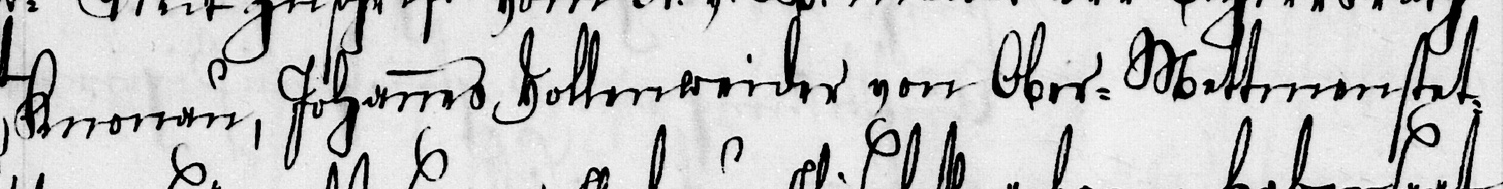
Knonau, Johannes Vollenweider von Ober-Mettmenstet¬
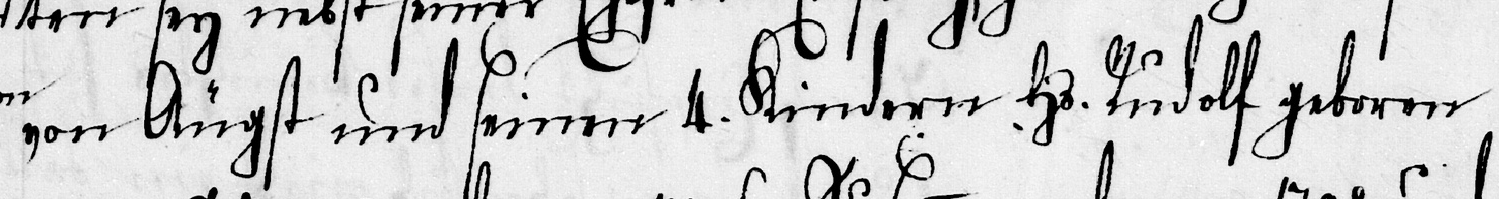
von Äugst und seinen 4. Kindern Hs. Rudolf geboren
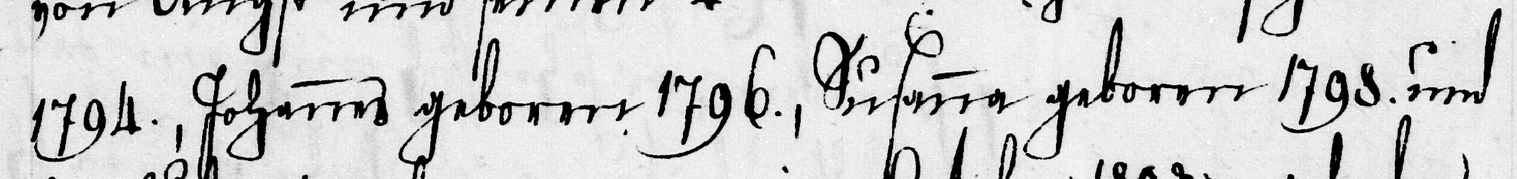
1794., Johannes geboren 1796., Susanna geboren 1798. und
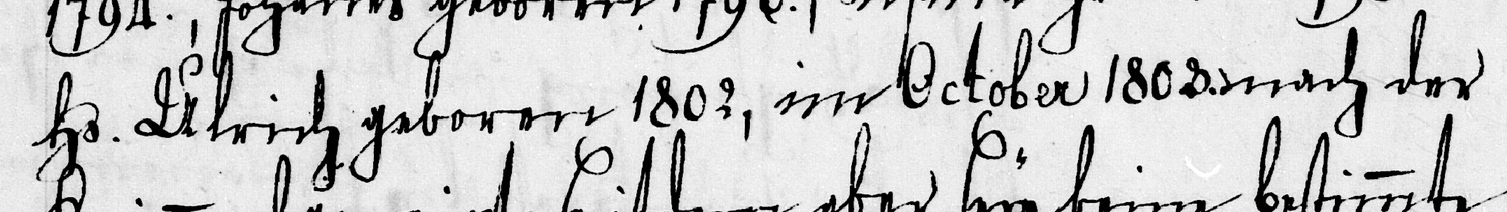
Hs. Ulrich geboren 1802, im October 1808, nach der
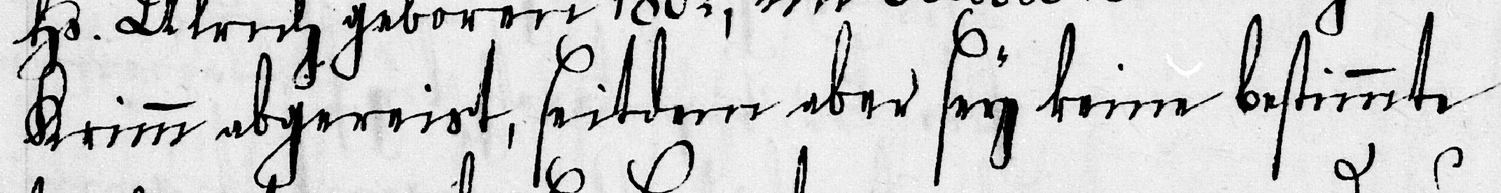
Krim abgereist, seitdem aber sey keine bestimmte
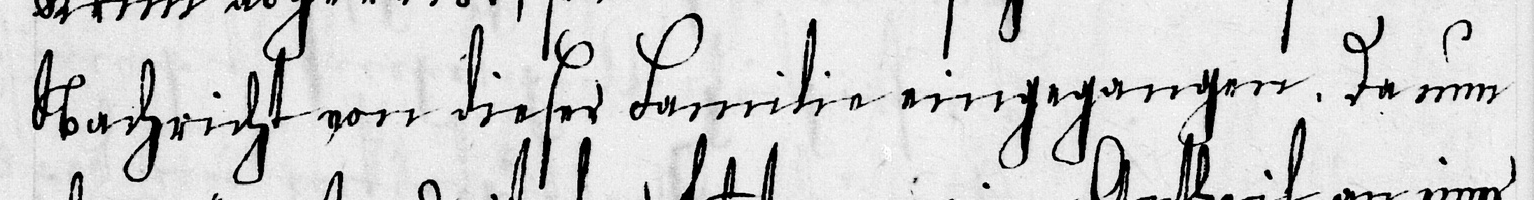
Nachricht von dieser Familie eingegangen. Da nun
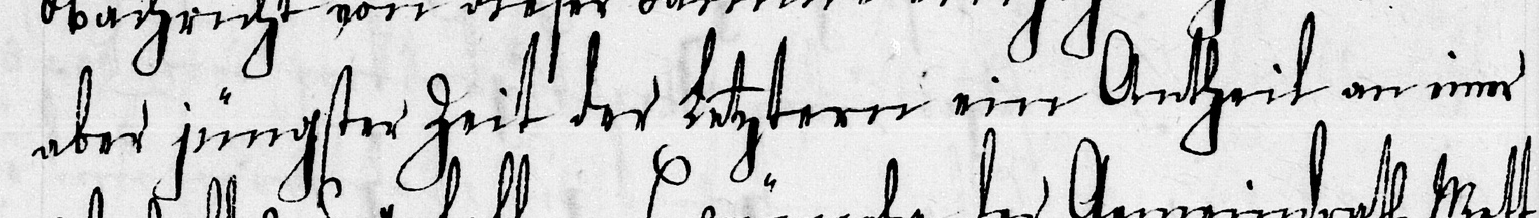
aber jüngster Zeit der Letztern ein Antheil an einer
